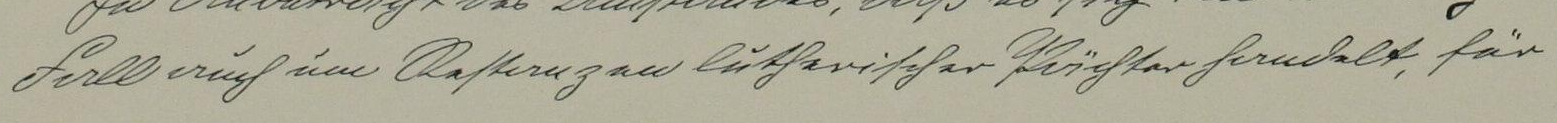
Fall auch um Restanzen lutherischer Pächter handelt, für
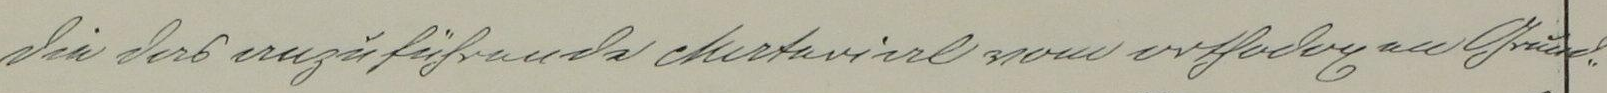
die das anzuführende Material vom orthodoxen Grund-
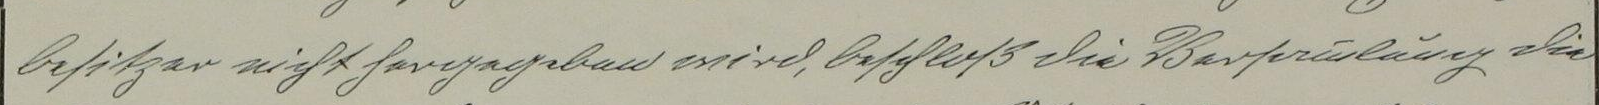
besitzer nicht hergegeben wird, beschloß die Versammlung die
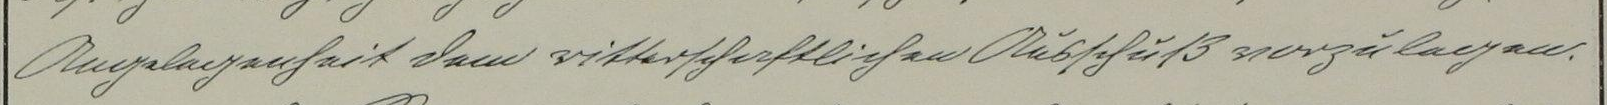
Angelegenheit dem ritterschaftlichen Ausschuß vorzulegen.
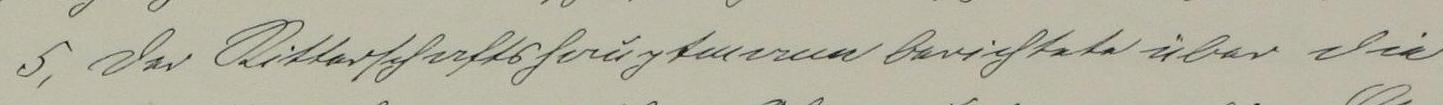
5. Der Ritterschaftshauptmann berichtete über die
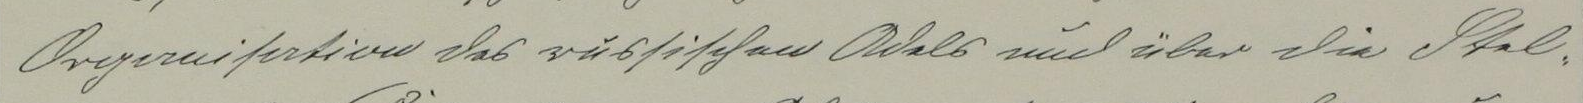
Organisation des russischen Adels und über die Stel-
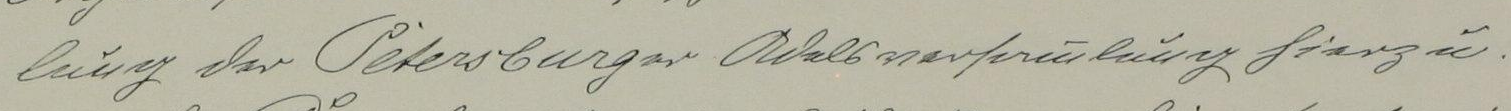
lung der Petersburger Adelsversammlung hierzu.
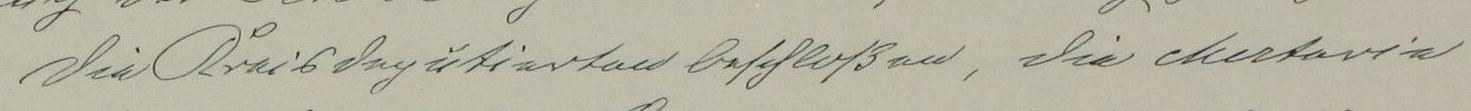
Die Kreisdeputierten beschloßen, die Materie
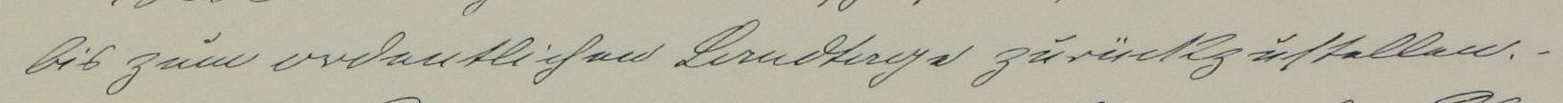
bis zum ordentlichen Landtage zurückzustellen.
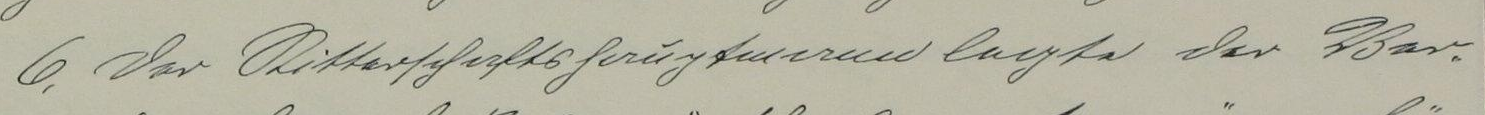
6. Der Ritterschaftshauptmann legte der Ver-
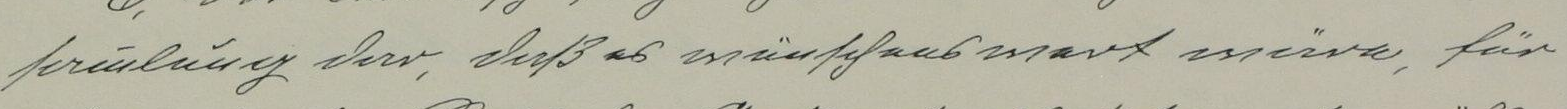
sammlung dar, daß es wünschenswert wäre, für
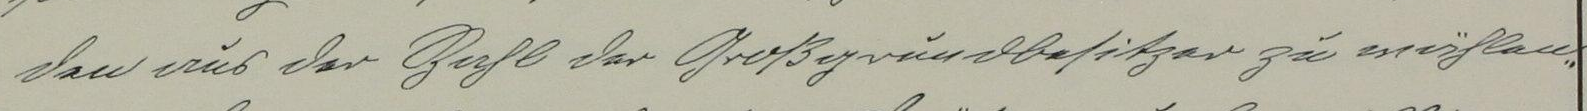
den aus der Zahl der Großgrundbesitzer zu wählen-
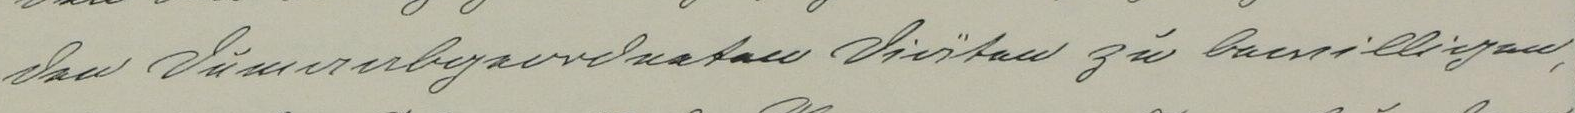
den Dumaabgeordneten Diäten zu bewilligen,
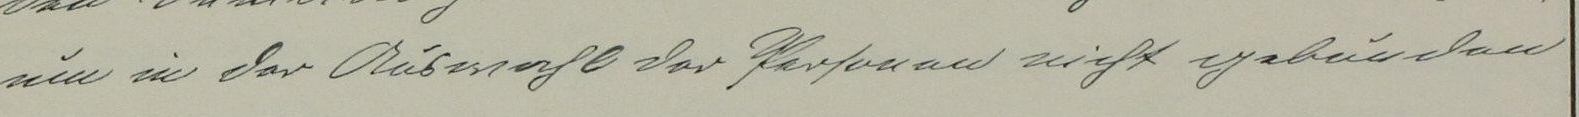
um in der Auswahl der Personen nicht gebunden
